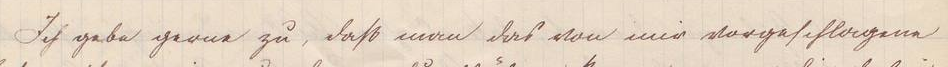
Ich gebe gerne zu, daß man das von mir vorgeschlagene
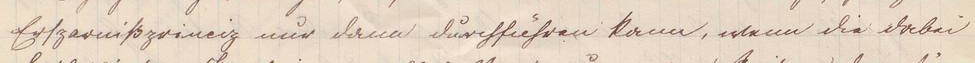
Ersparnißprincip nur dann durchführen kann, wenn die dabei
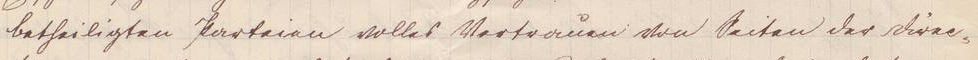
betheiligten Parteien volles Vertrauen von Seiten der Direc-
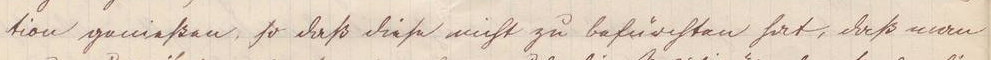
tion genießen, so daß diese nicht zu befürchten hat, daß man
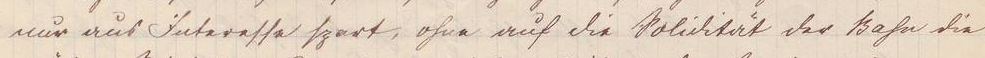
nur aus Interesse spart, ohne auf die Solidität der Bahn die
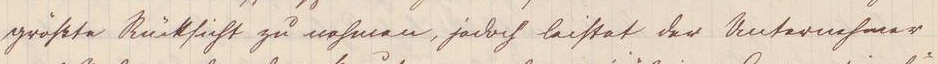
größte Rücksicht zu nehmen, jedoch leistet der Unternehmer
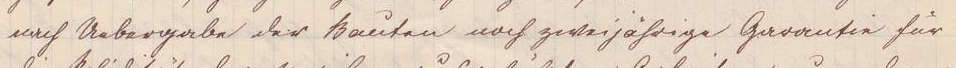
nach Uebergabe der Bauten noch zweijährige Garantie für
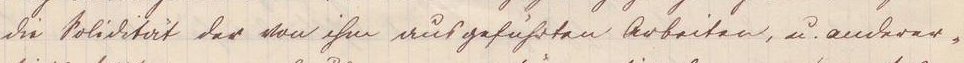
die Solidität der von ihm ausgeführten Arbeiten, u. anderer-
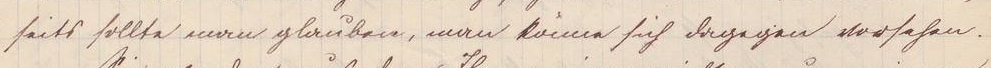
seits sollte man glauben, man könne sich dagegen vorsehen.
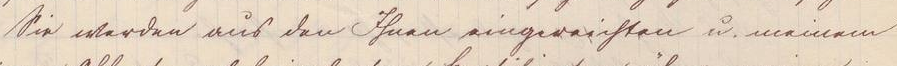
Sie werden aus den Ihnen eingereichten u. meinem
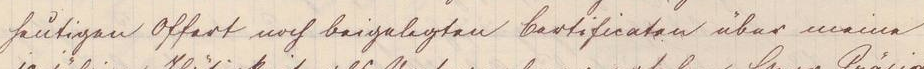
heutigen Offert noch beigelegten Certificaten über meine
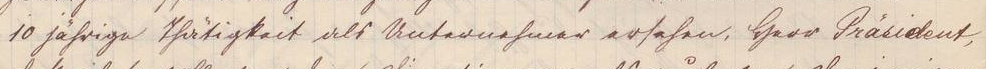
10 jährige Thätigkeit als Unternehmer ersehen, Herr Präsident,
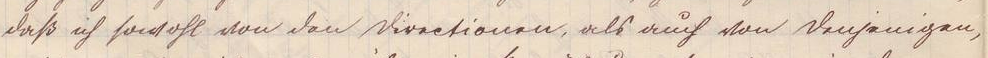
daß ich sowohl von den Directionen, als auch von denjenigen,
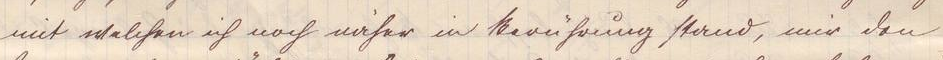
mit welchen ich noch näher in Berührung stand, mir den
